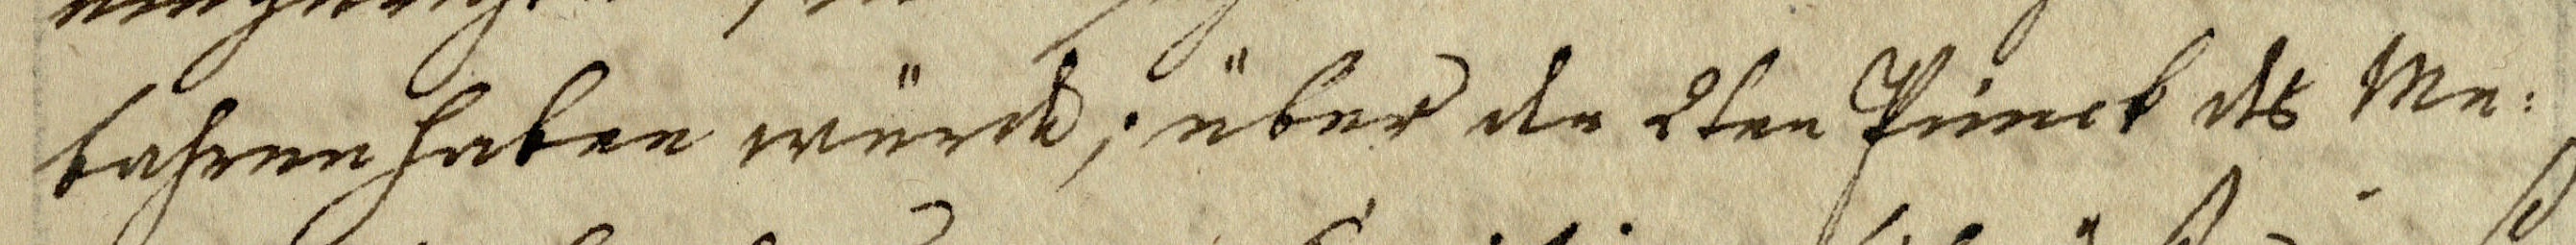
bahren haben würde, über den 2 ten Punct des Me¬
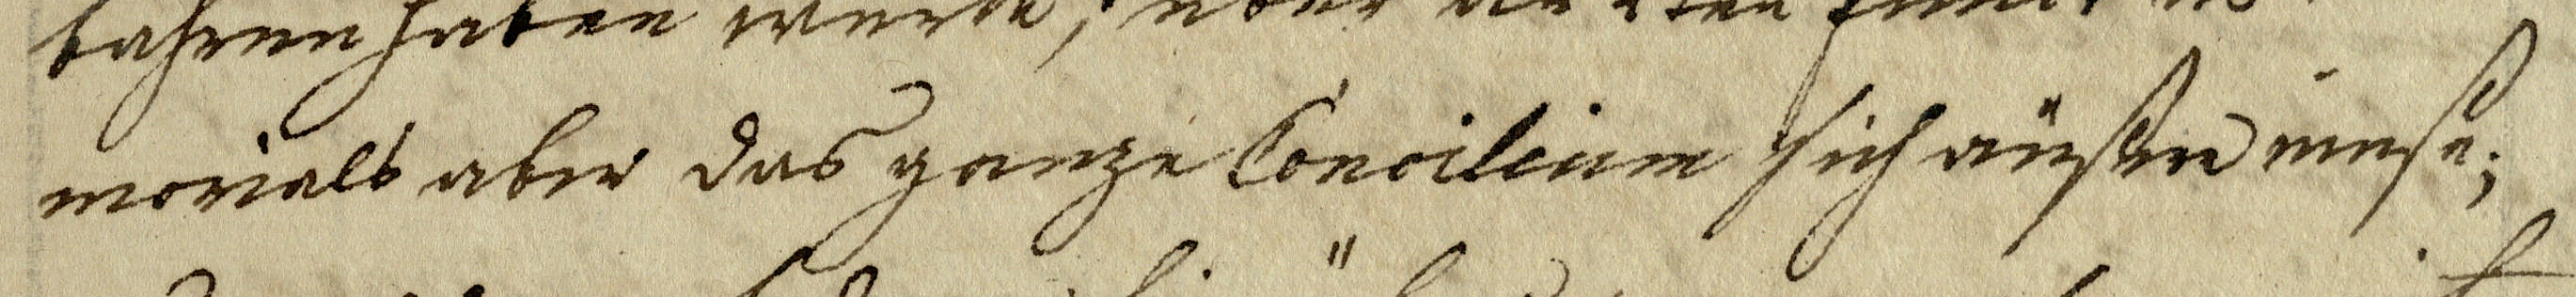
morials aber das ganze Concilium sich äußern müße;
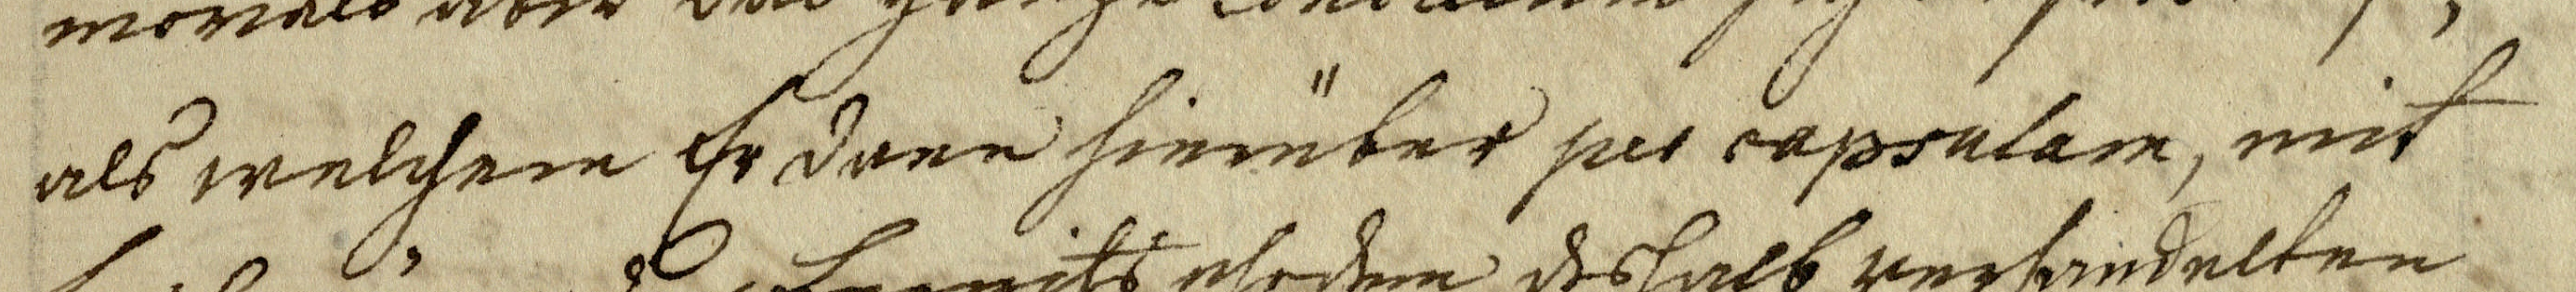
als welchem Er dann hierüber per capsulam, mit
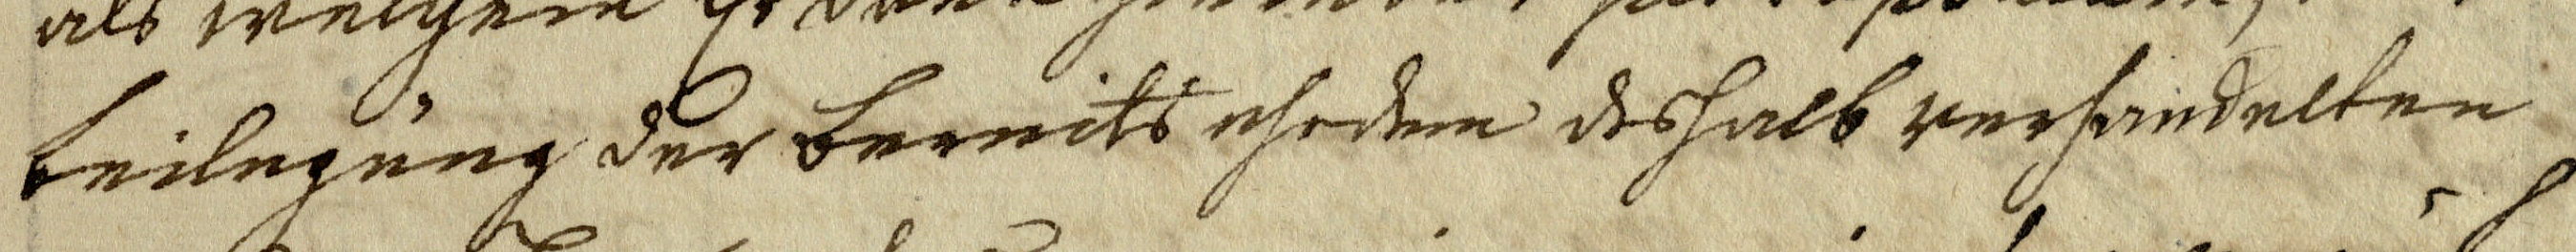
Beilegung der bereits ehedem deshalb verhandelten
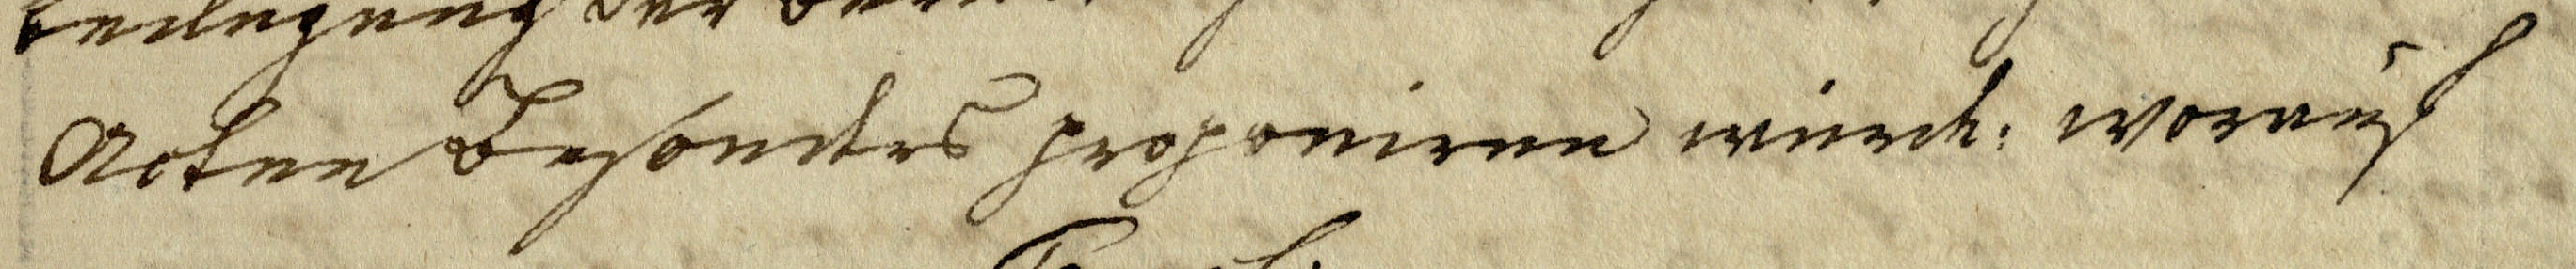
Acten besonders proponiren würde, worauf
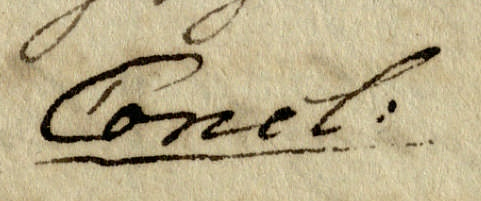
Concl.
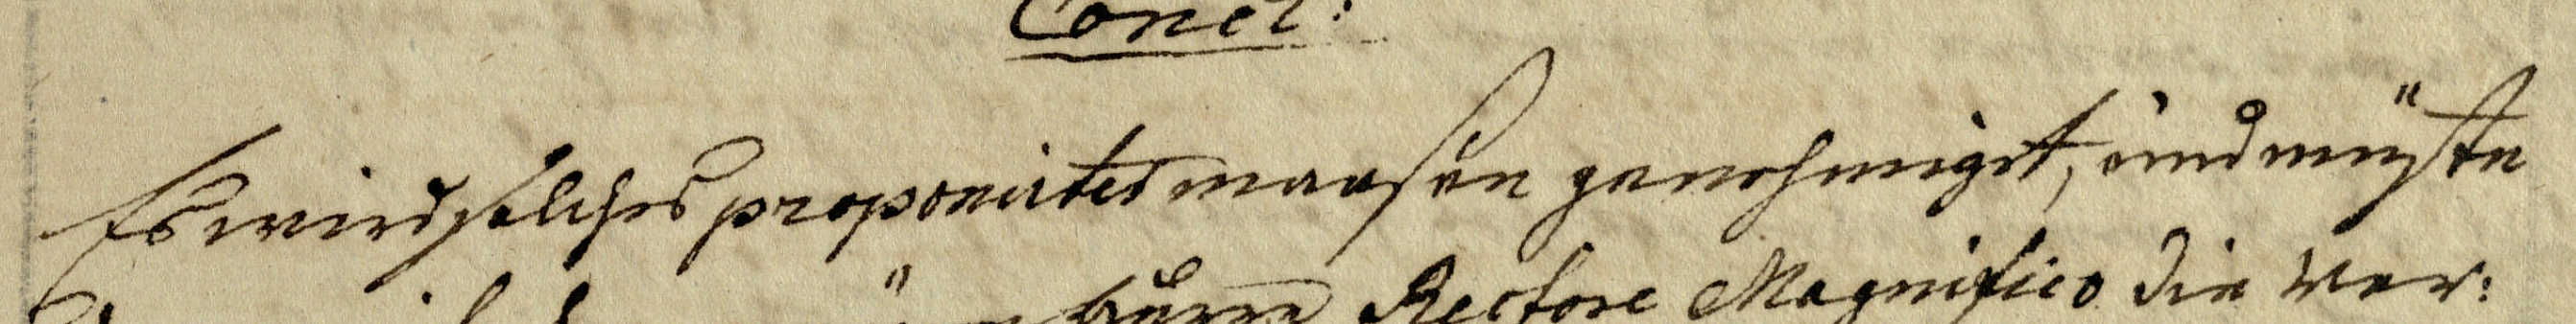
Es wird solches proponirter maaßen genehmiget, und müste
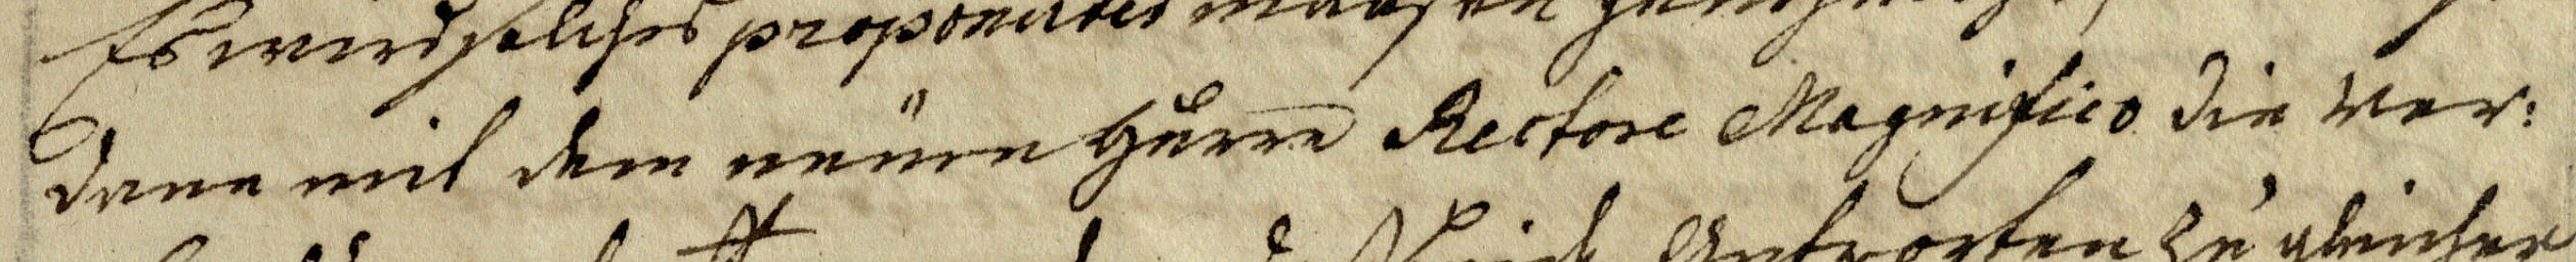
dann mit dem neuen Herrn Rectore Magnifico die Ver¬
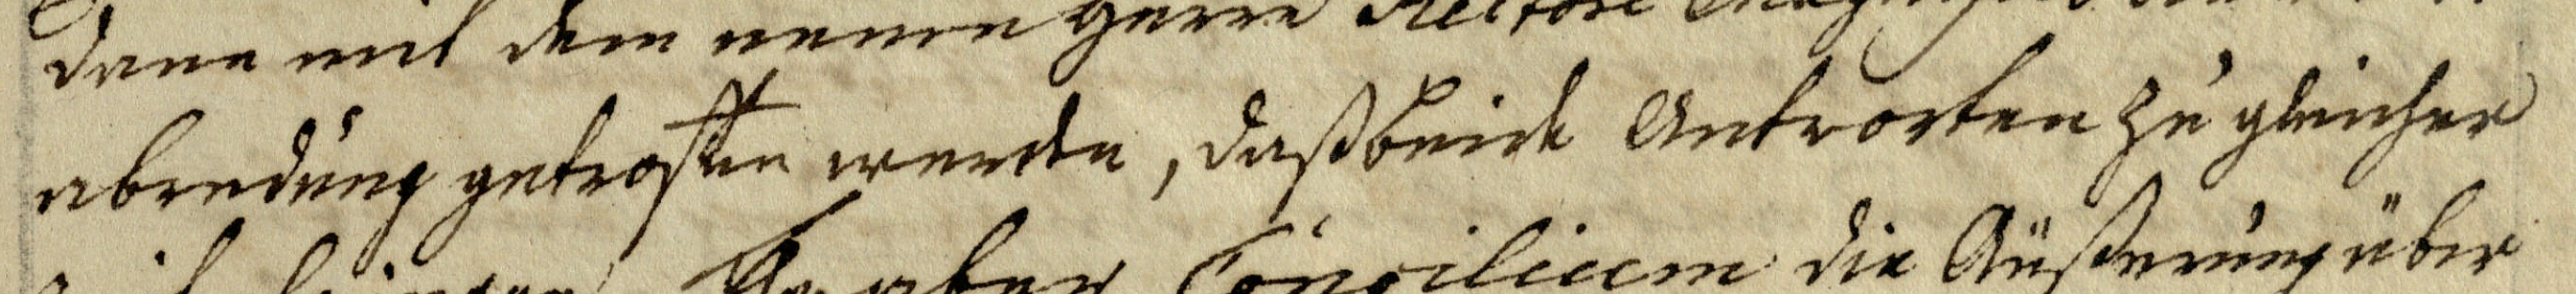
abredung getroffen werden, daß beide Antworten zu gleicher
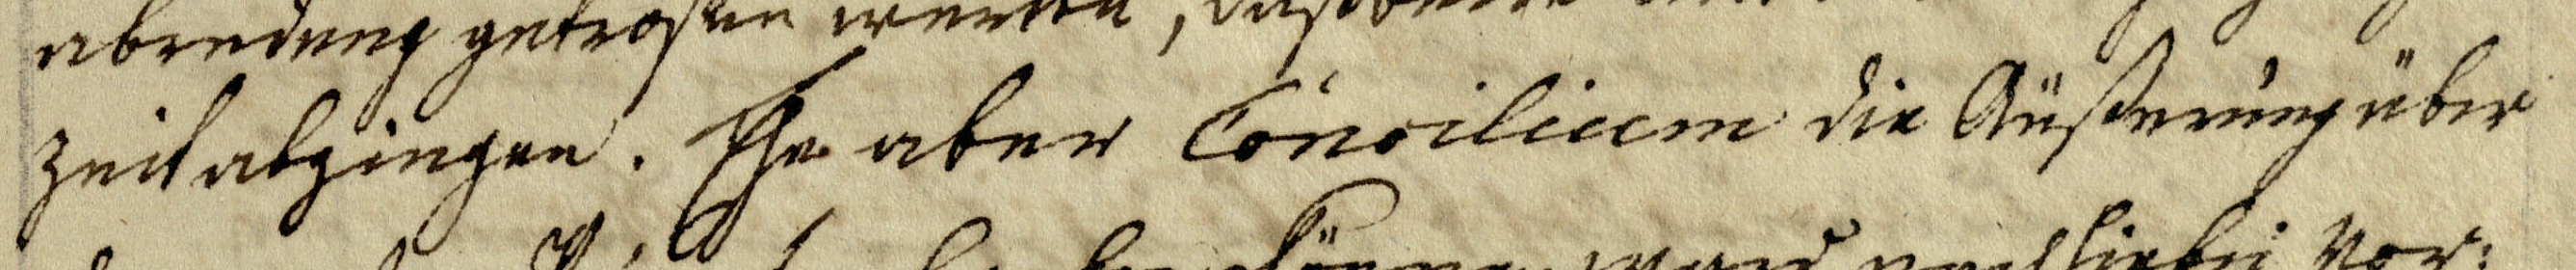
Zeit abgingen. Ehe aber Concilium die Äußerung über
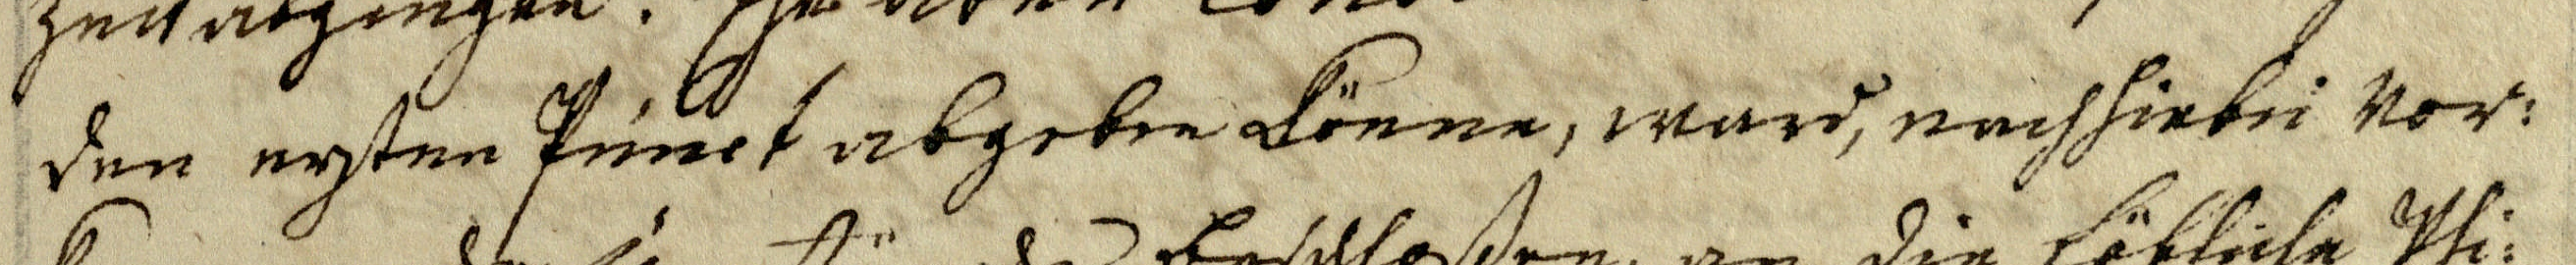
den ersten Punct abgeben könne, ward, nach hiebei vor¬
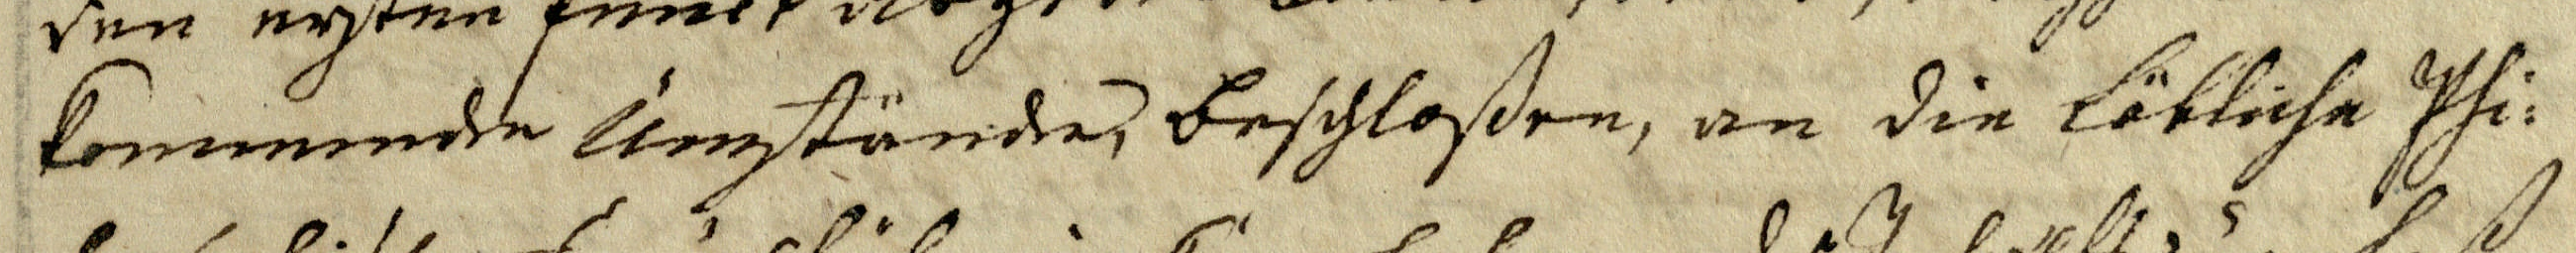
kommenden Umständen, beschloßen, an die Löbliche Phi¬
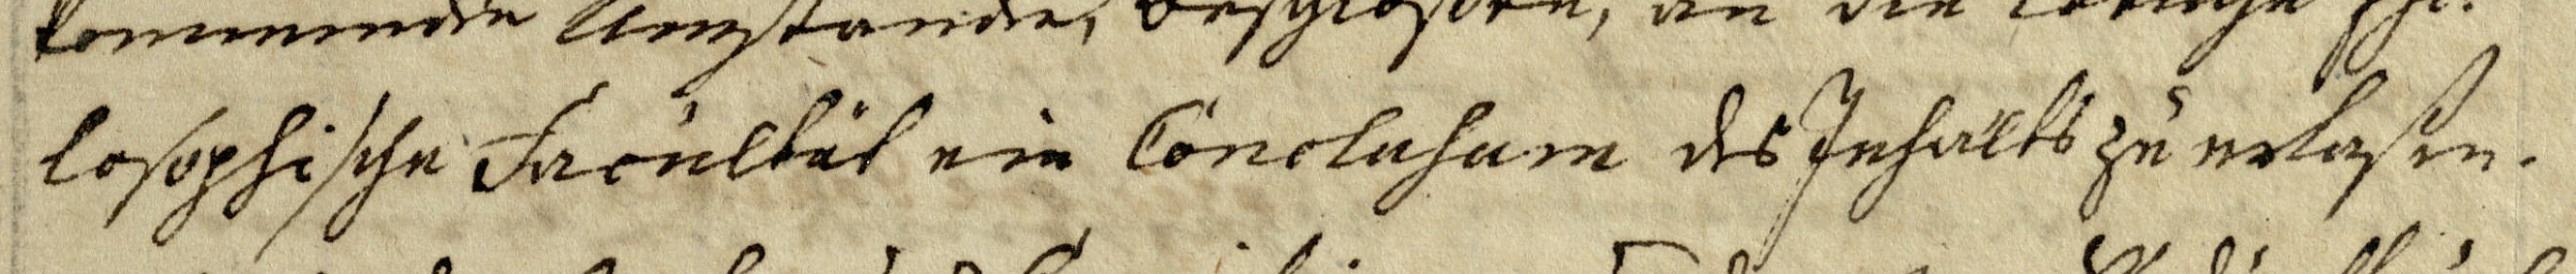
losophische Facultät ein Conclusum des Inhalts zu erlaßen.
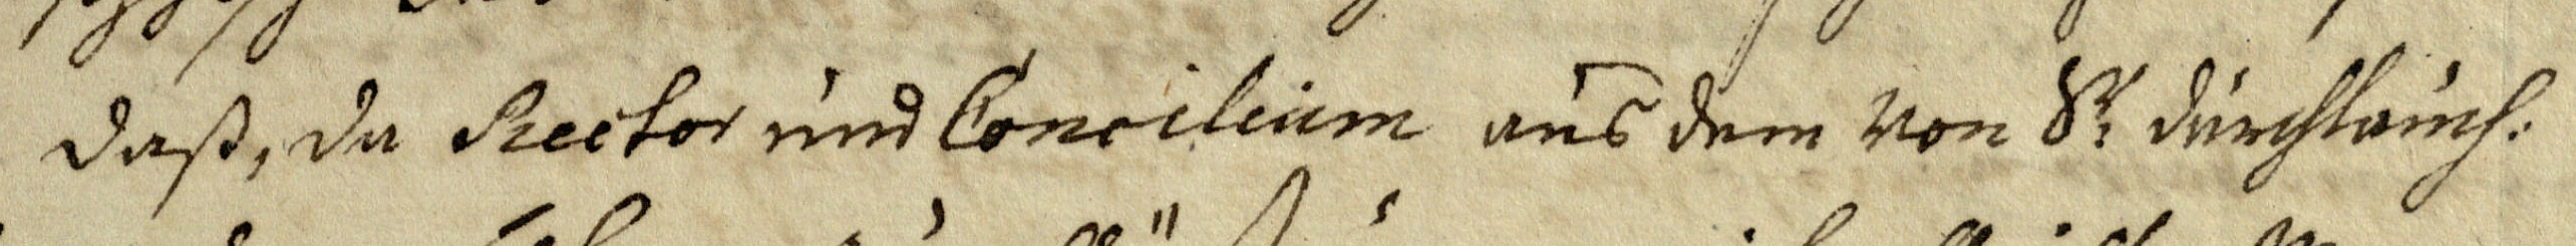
Daß, da Rector und Concilium aus dem von Sr Durchlauch¬
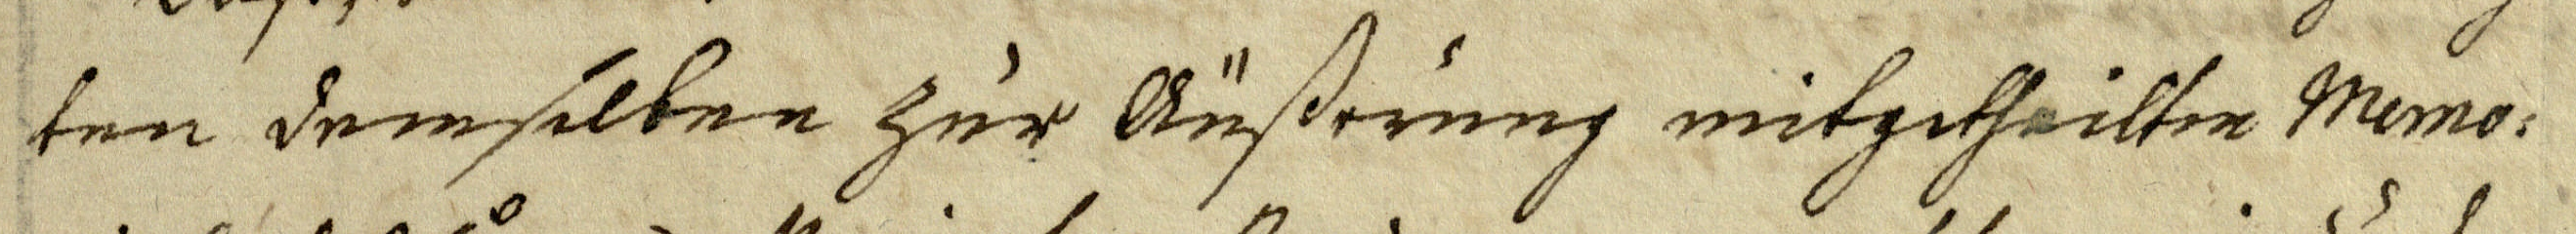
ten demselben zur Äusserung mitgetheilten Memo¬
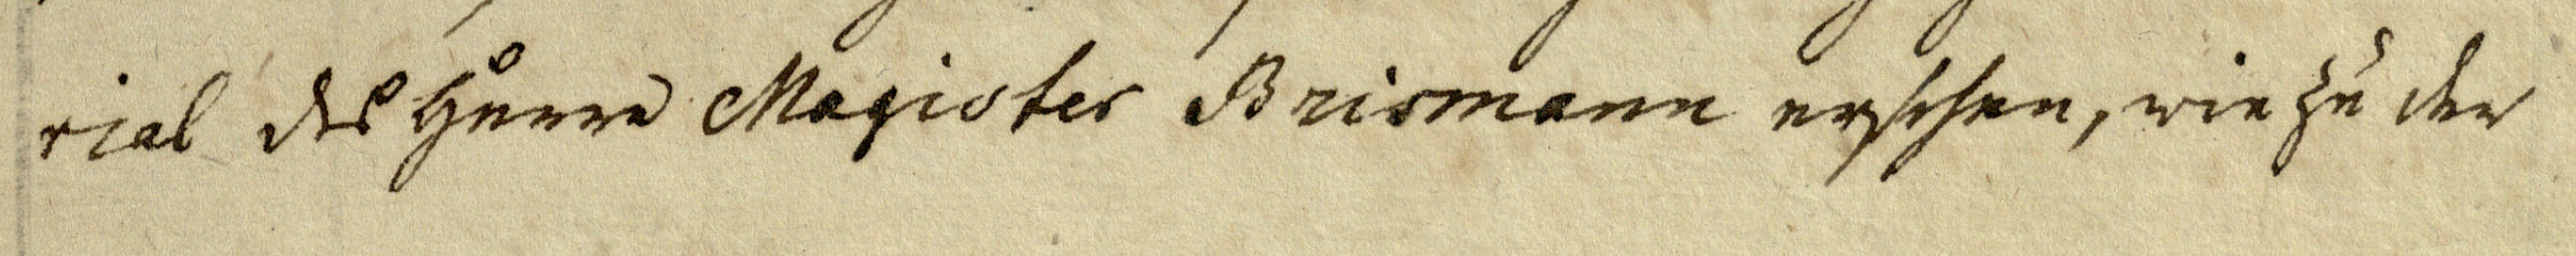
rial des Herrn Magister Brismann ersehen, wie zu der
